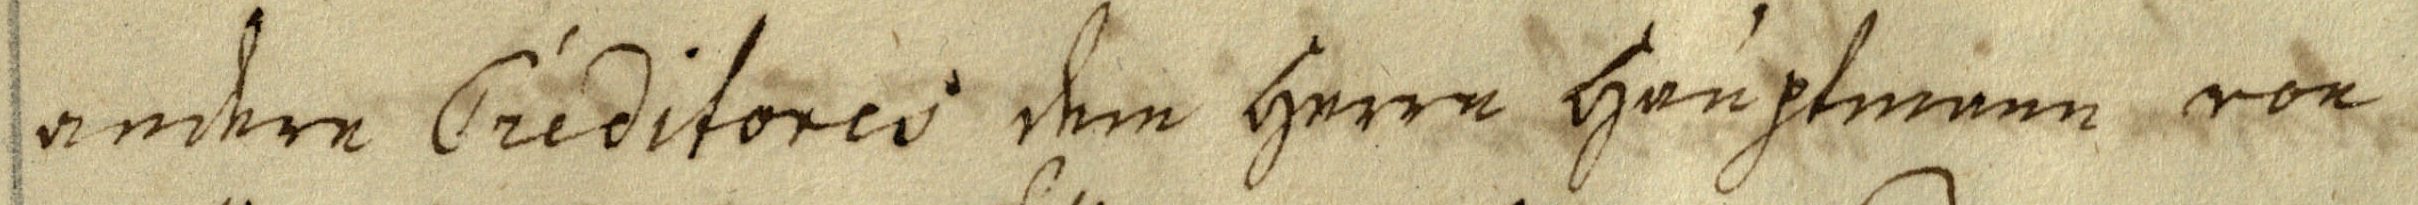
andere Creditores dem Herrn Hauptmann von
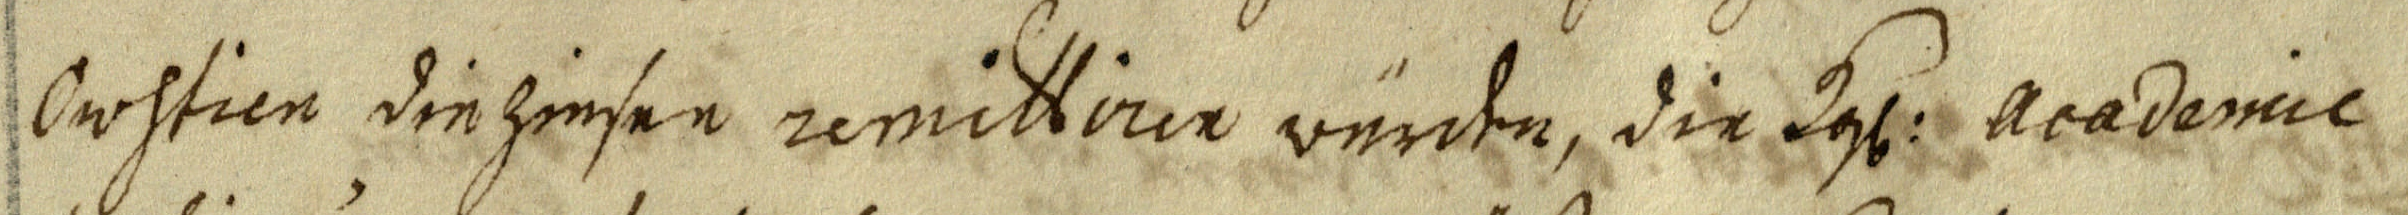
Owstien die Zinsen remittiren würden, die Kgl. Academie
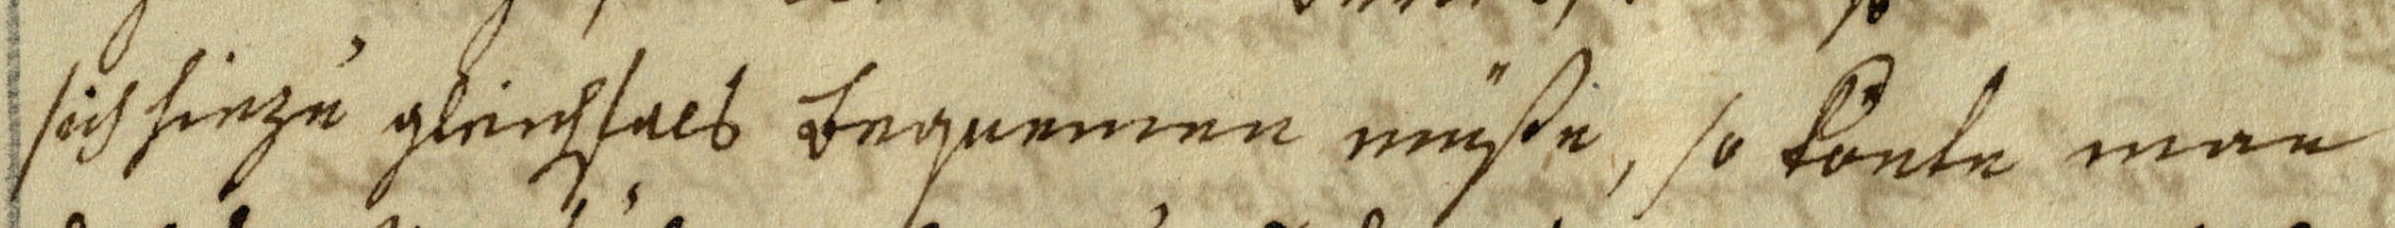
sich hiezu gleichfals bequemen müße, so könte man
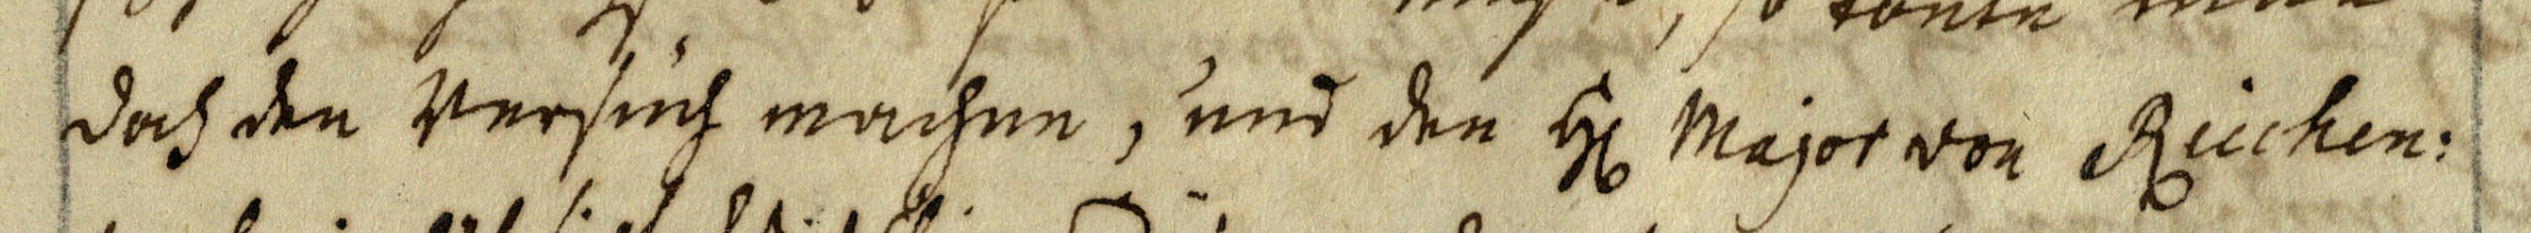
doch den Versuch machen, und den H Major von Reichen¬
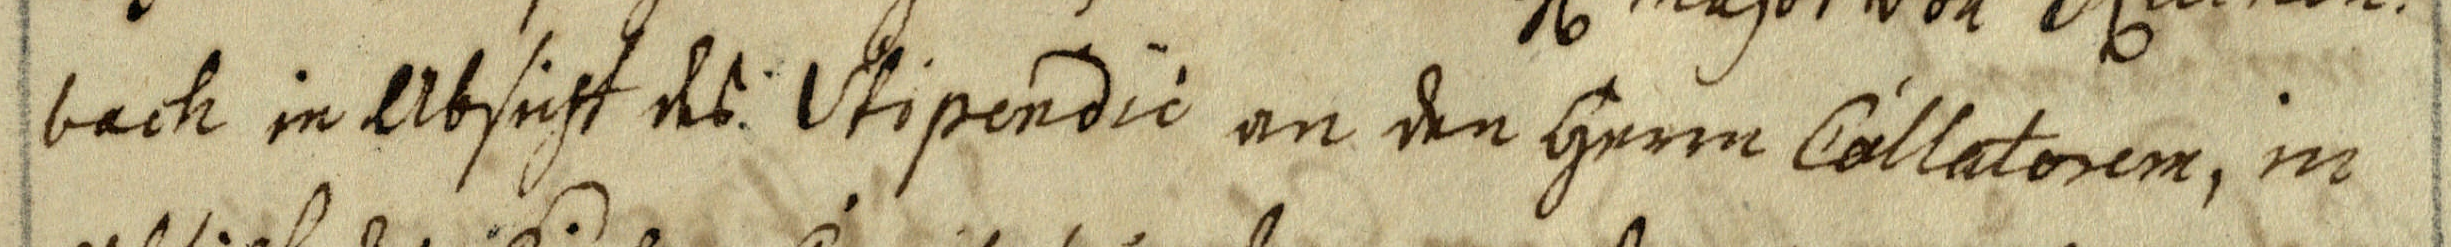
bach in Absicht des Stipendii an den Herrn Collatorem, in
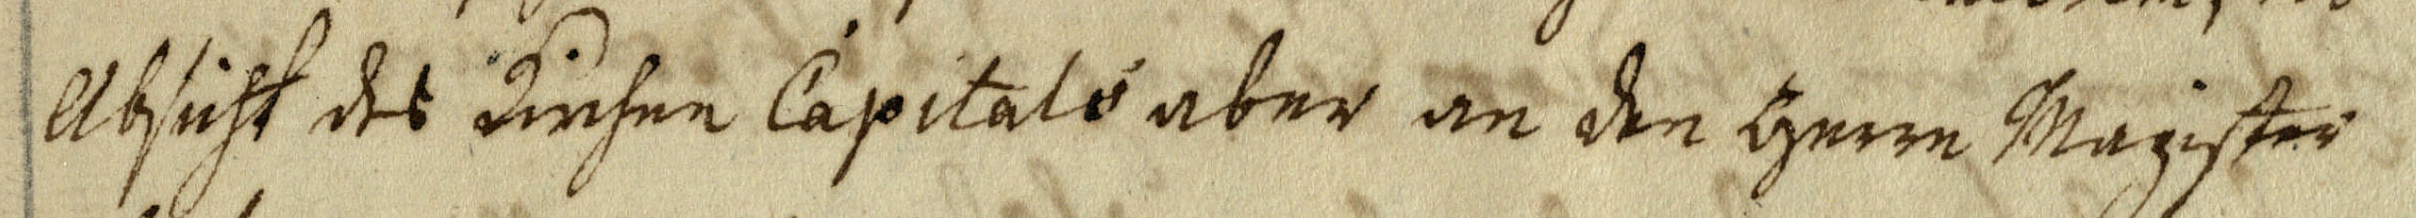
Absicht des Kirchen Capitals aber an den Herrn Magister
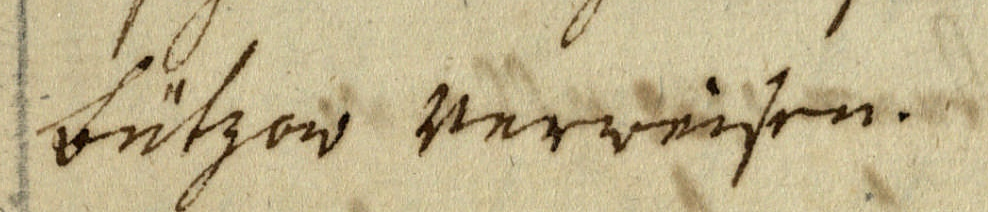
Lützow verweisen.
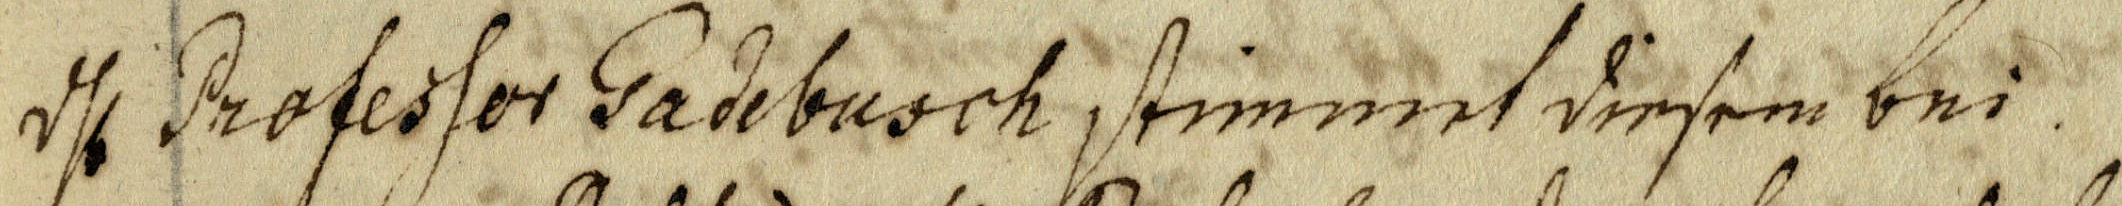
dh Professor Gadebusch stimmet diesem bei.
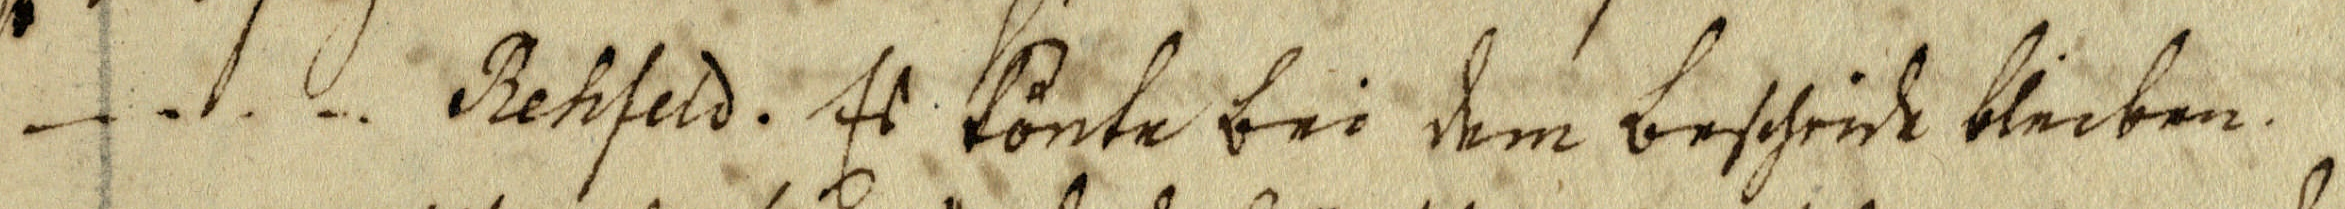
Rehfeld. Es könte bei dem Bescheide bleiben.
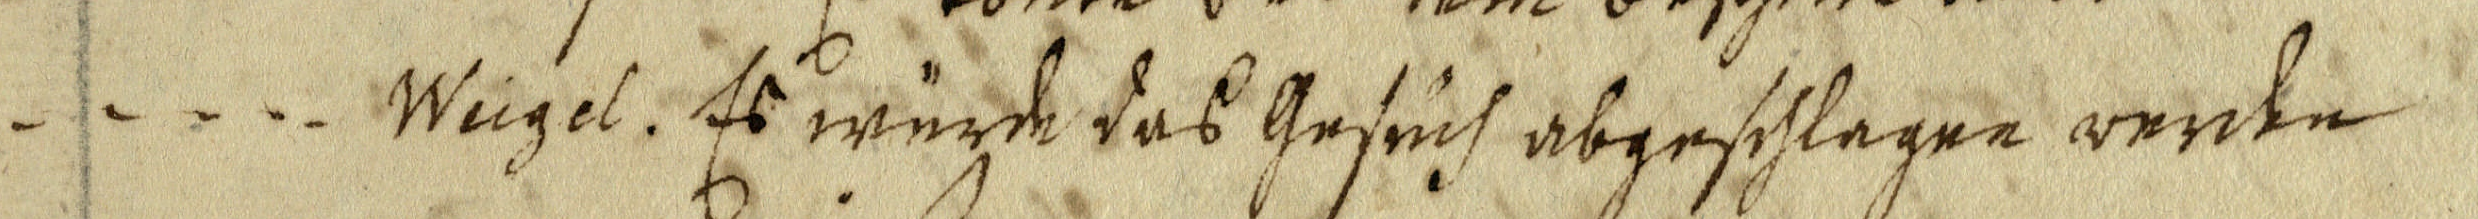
Weigel. Es würde das Gesuch abgeschlagen werden
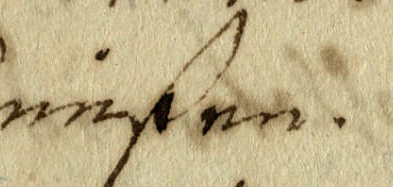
müßen.
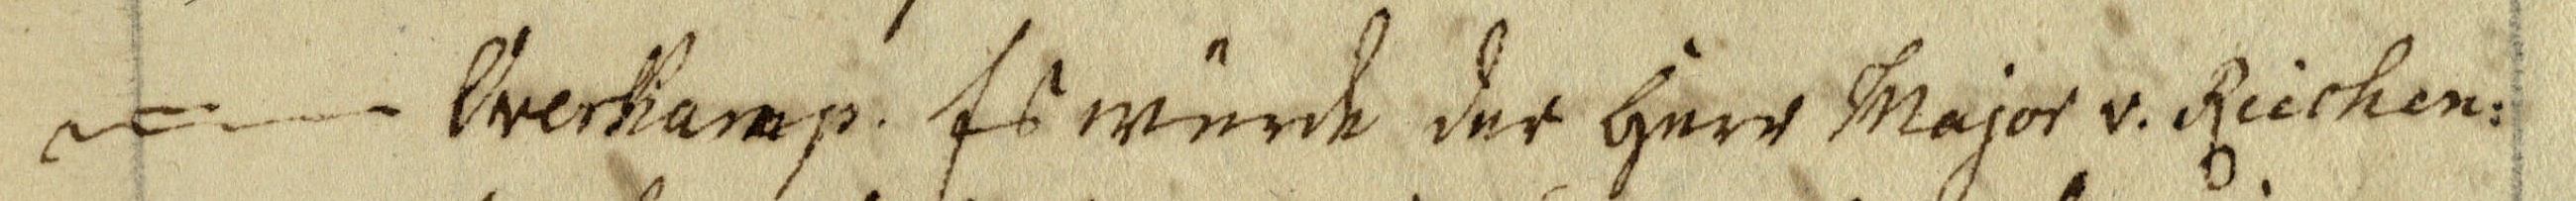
Overkamp. Es würde der Herr Major v. Reichen¬
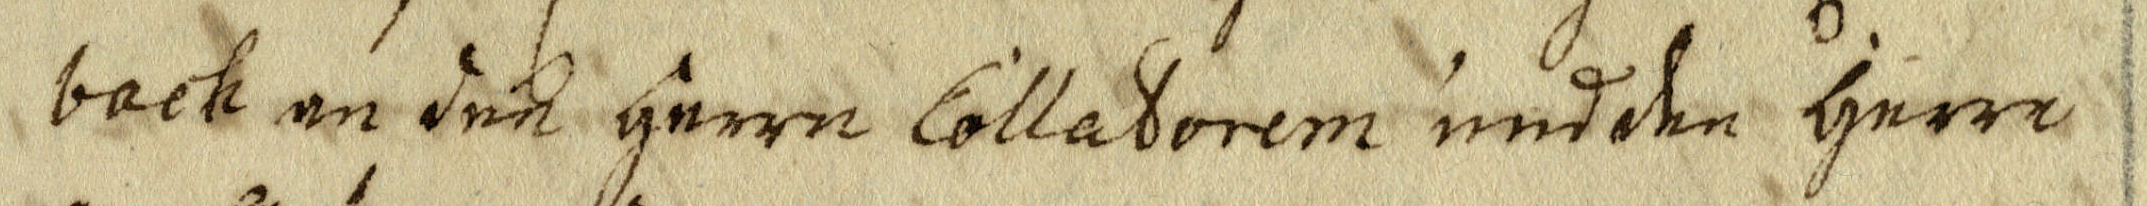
bach an den Herrn Collatorem und den Herrn
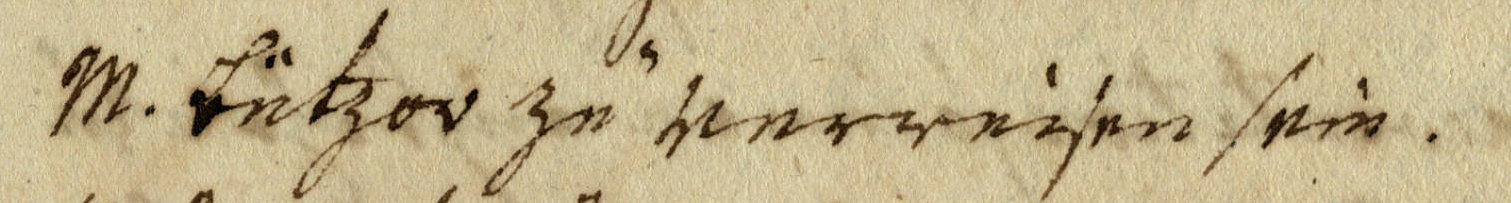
M. Lützow zu verweisen sein.
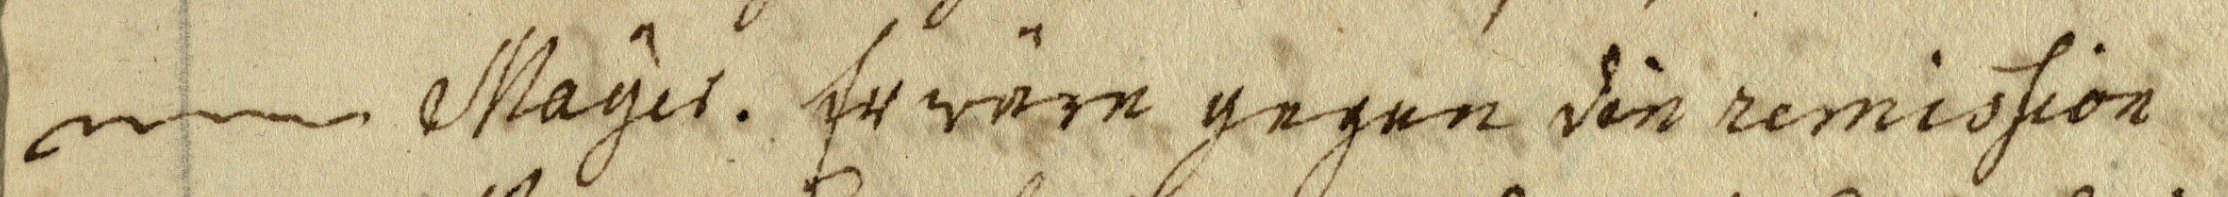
Maÿer. Er wäre gegen die remission
